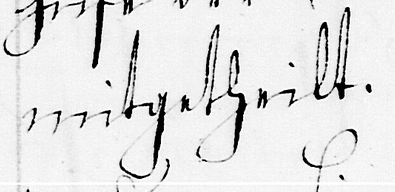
mitgetheilt.
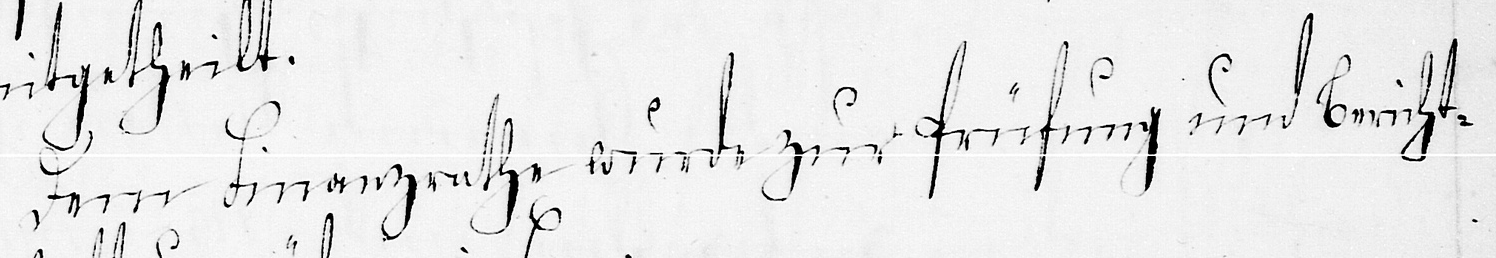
Dem Finanzrathe wurde zur Prüfung und Bericht¬
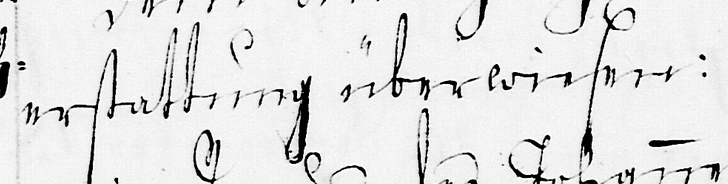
erstattung überwiesen:
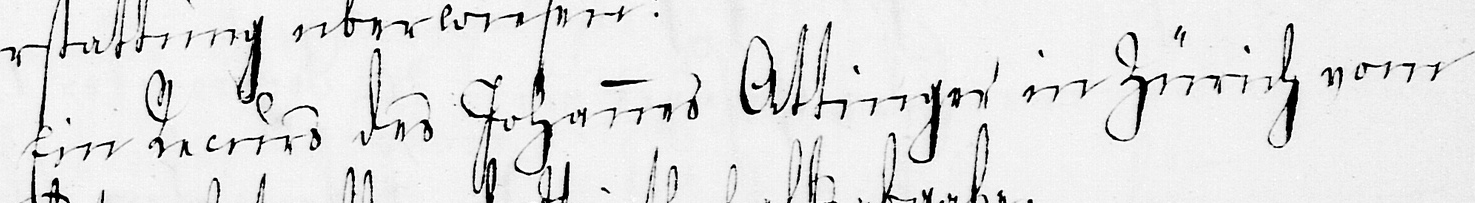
Ein Recurs des Johannes Attinger in Zürich vom
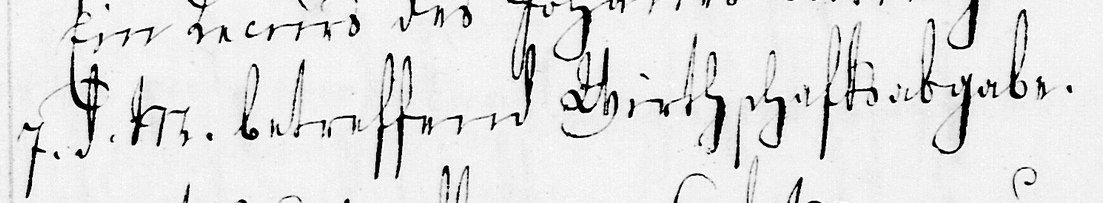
7. d. M. betreffend Wirthschaftsabgabe.
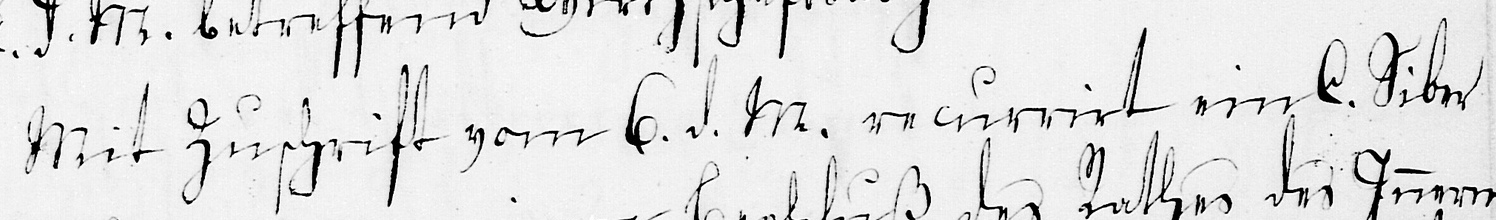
Mit Zuschrift vom 6. d. M. recurrirt ein C. Siber
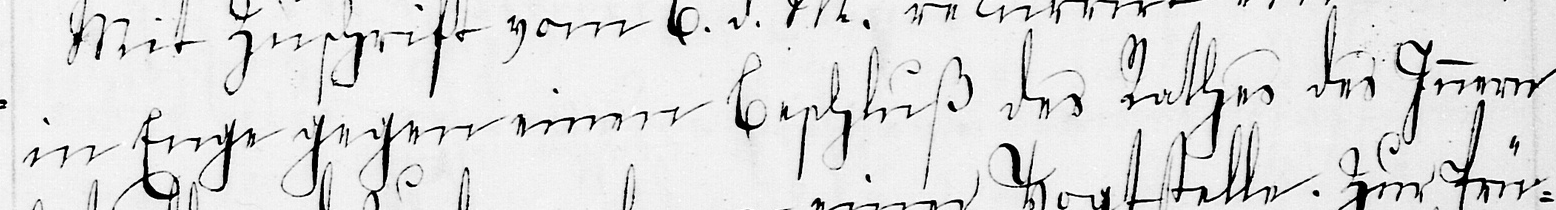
in Enge gegen einen Beschluß des Rathes des Innern
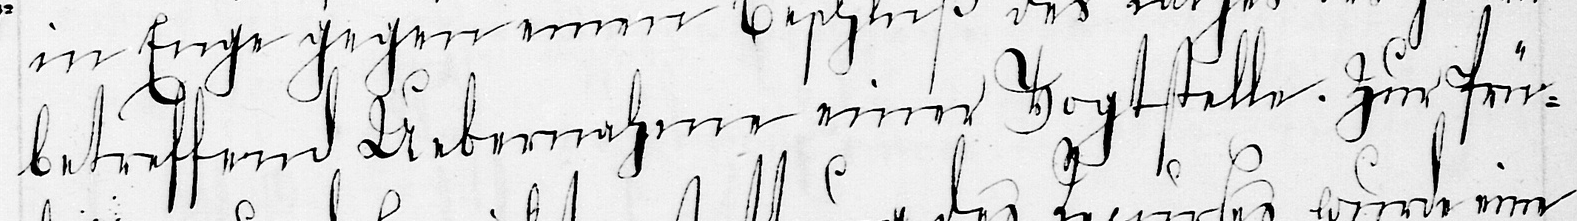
betreffend Uebernahme einer Vogtstelle. Zur Prü¬
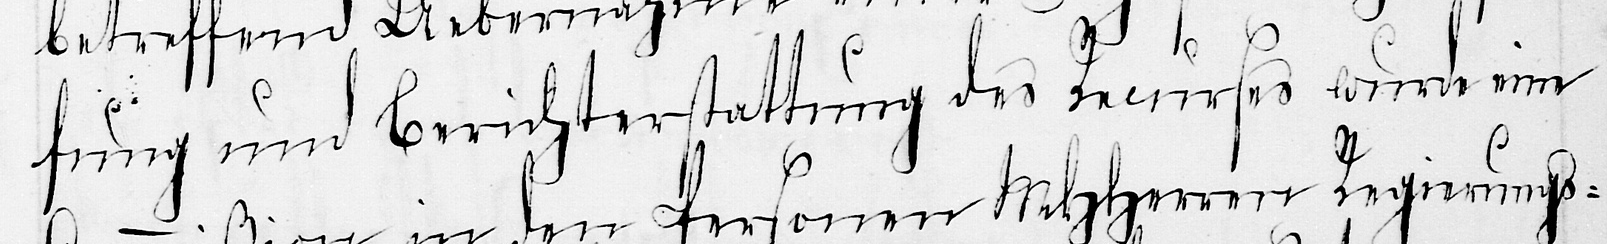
fung und Berichterstattung des Recurses wurde eine
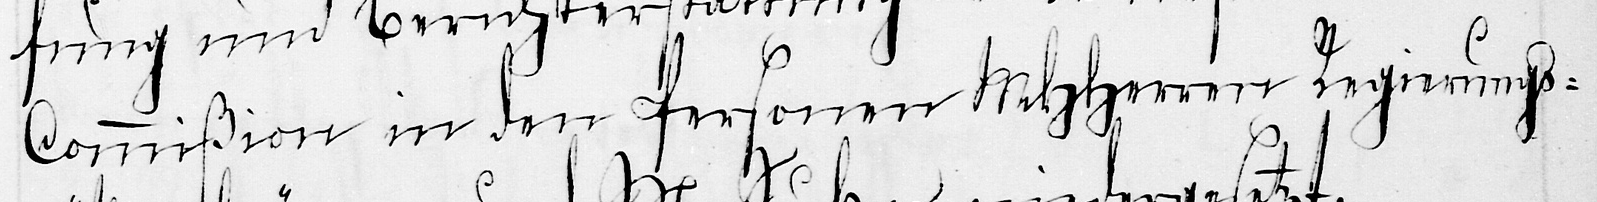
Commißion in den Personen MHHerren Regierungs¬
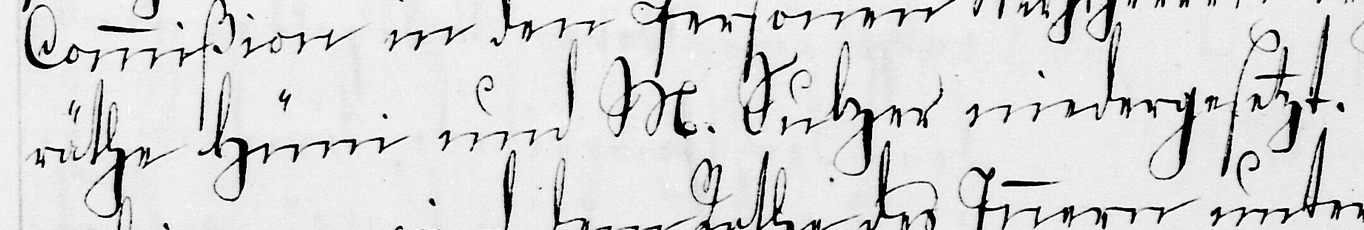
räthe Hüni und M. Sulzer niedergesetzt.
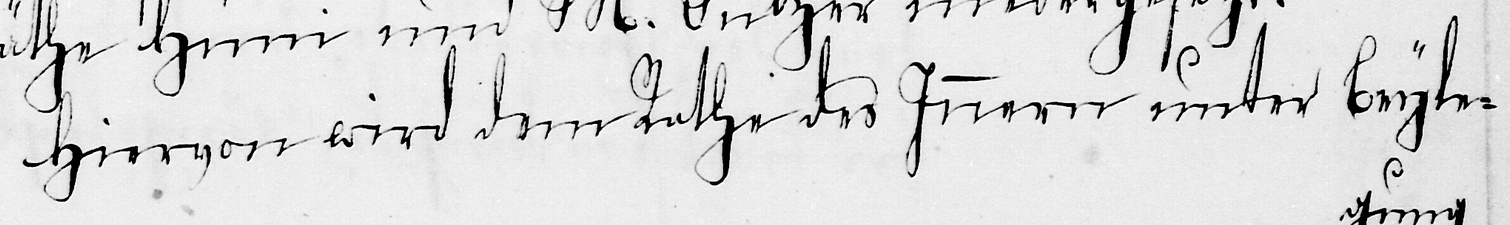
Hiervon wird dem Rathe des Innern unter Beyle-
